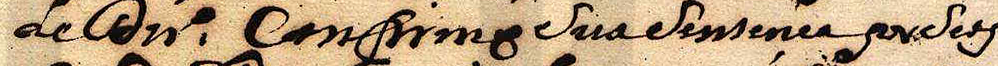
de Dir.o Confirmaõ Sua Sentença por Seos
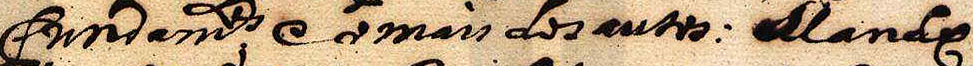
fundam.tos e o mais dos autos: Mando
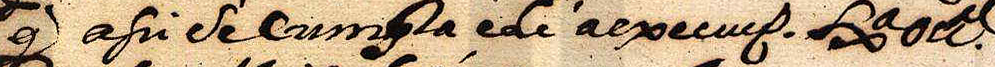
q̄ assi se cumpra e dé execuçaõ. Lxa occ.al
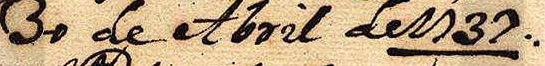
30 de Abril de 1737.
